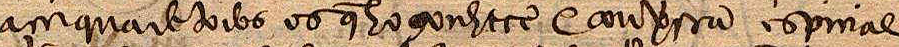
acerqua de todos os q̄ ho conheçē e conꝟssam̄ espicial
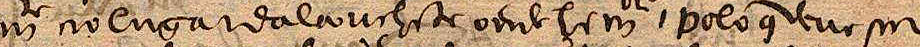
mte no lugar dalcouchete onde he mor , polo q̄ deue seer
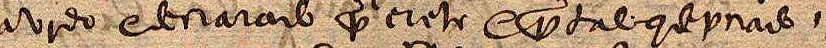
avjdo e decrarado p̄o ereJe e p̄o tal ꝯdepnado ,
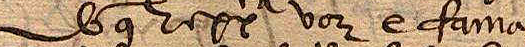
do q̄ he ppca voz e fama
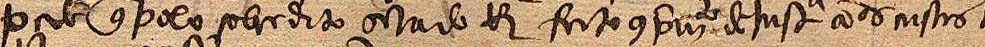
pede q̄ polo sobredito seja do R feito ꝯp̄mto de Justa cō as custas /
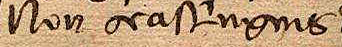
Non se astingens c̄
